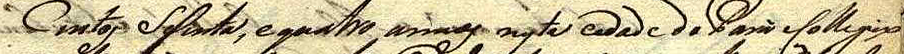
Centos sesenta, e quatro annos nesta cidade do Pará e Collegio
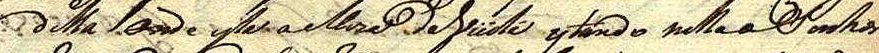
della onde esta a Meza da Visita estando nella o Senhor
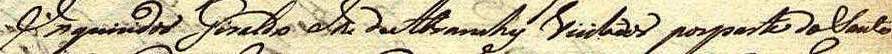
Inquisidor Giraldo Joze de Abranches Visitador por parte do Santo
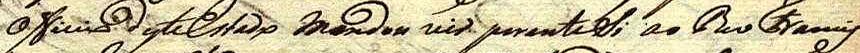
officio deste Estado mandou vir perante Si ao Reo Francis
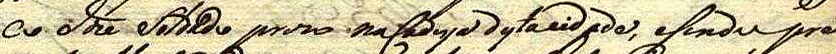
co Joze Soldado prezo na Cadeya desta cidade, e sendo pre
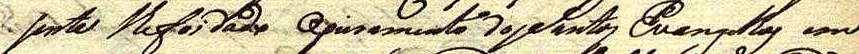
sente lhe foi dado o juramento dos Santos Evangelhos em
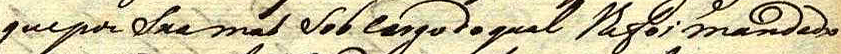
que poz Sua maõ sob cargo do qual lhe foi mandado
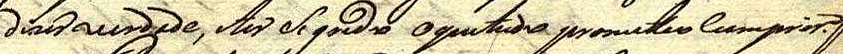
dizer verdade, e ter Segredo o que tudo prometeo cumprir.//
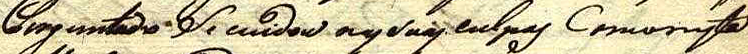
Perguntado se cuidou nas suas culpas com o nesta
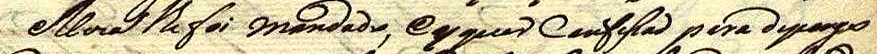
Meza lhe foi mandado, e as quer confessar para descargo
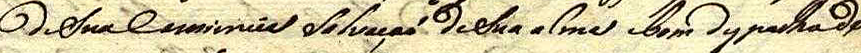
de Sua Consiencia Salvaçaõ de Sua alma e bom despacho de
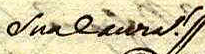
sua cauza.//
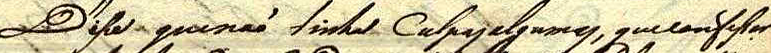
Disse que naõ tinha Culpas algumas, que confessar
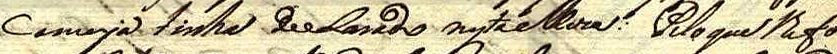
como ja tinha declarado nesta Meza: Pelo que lhe fo
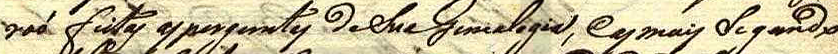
raõ feitas as perguntas de Sua Genealogia, e as mais segundo
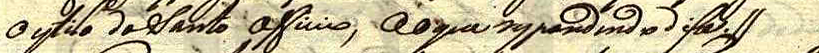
o estilo do Santo officio, ao que respondendo disse.//
